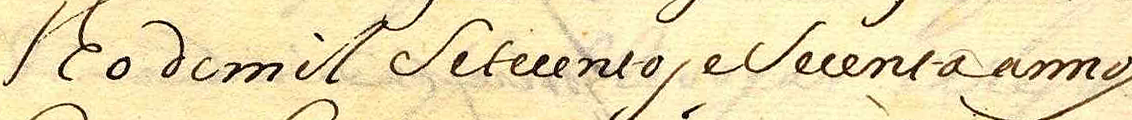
lho de mil Setecentos e Secenta annos
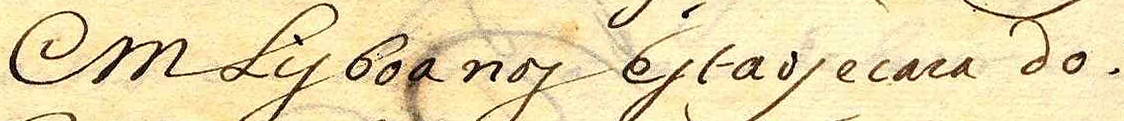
em Lisboa nos Estaos e caza do
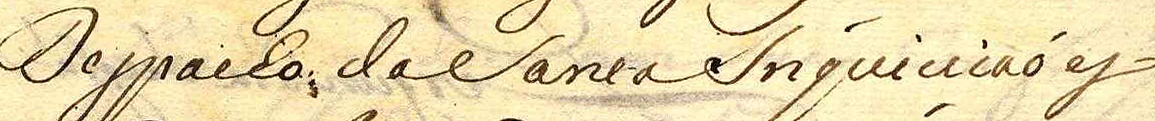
Despacho da Santa Inquiziçaõ es
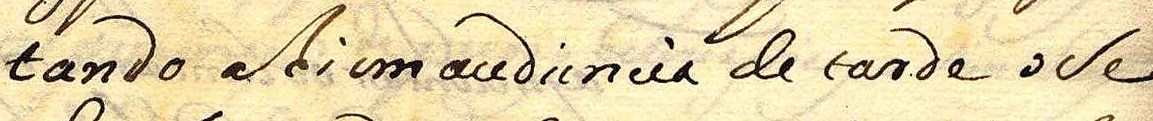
tando ahi em audiencia de tarde o Se
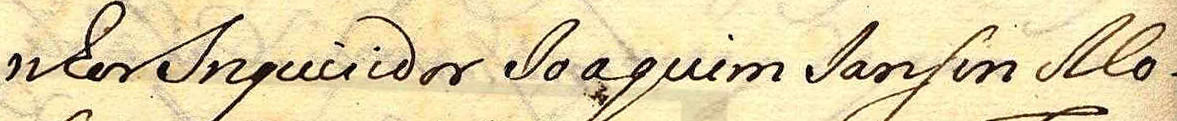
nhor Inquizidor Ioaquim Iansen Mo
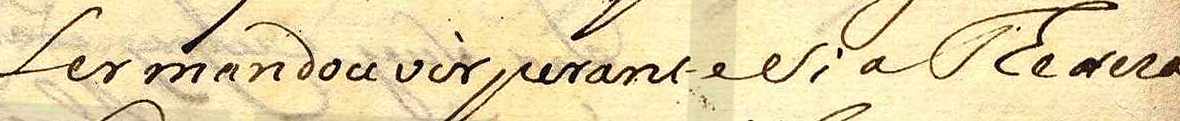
Ler mandou vir perante si a Thereza
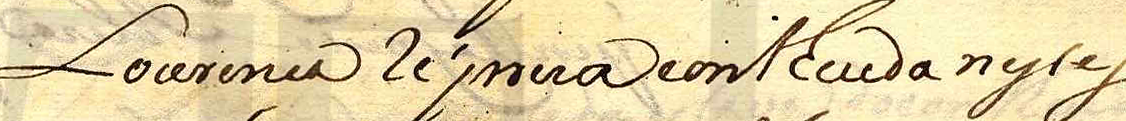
Lourença Ré preza contheuda nestes
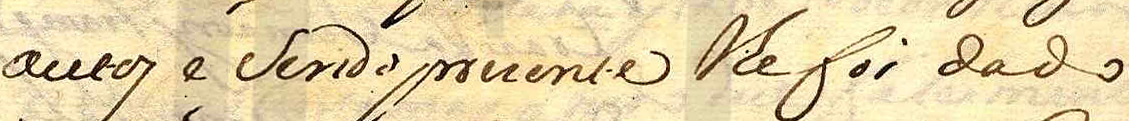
autos e Sendo prezente lhe foi dado
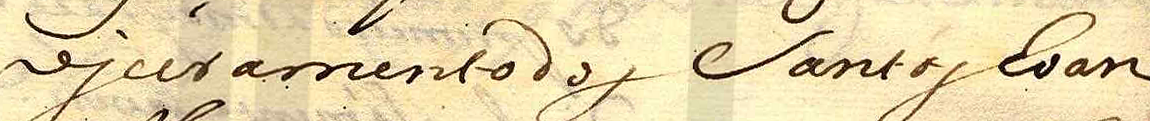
o juramento dos Santos Evan
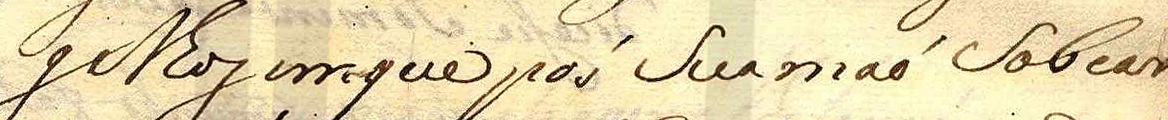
gelhos em que pós Sua maõ Sob car
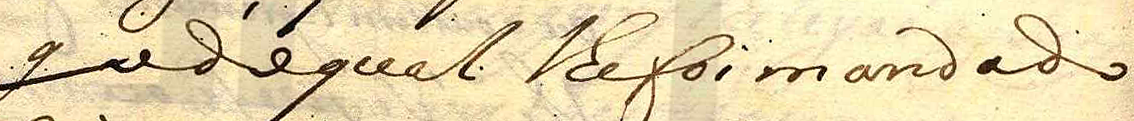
go do qual lhe foi mandado
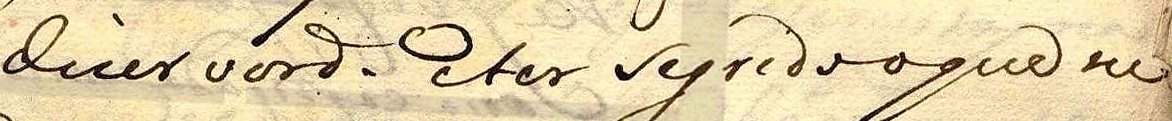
dizer verd.e e ter segredo o que tu
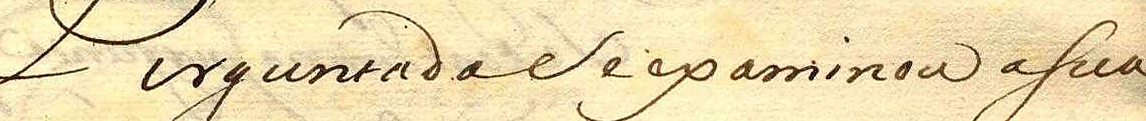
Perguntada Se examinou a sua
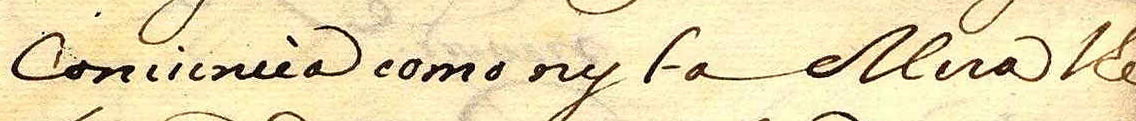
conciencia como nesta Meza lhe
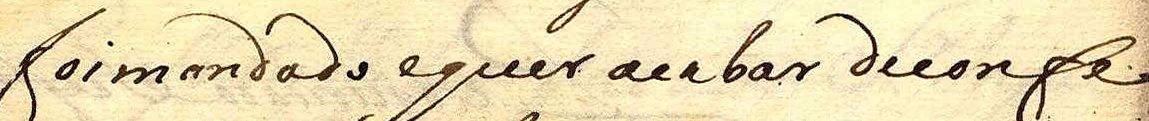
foi mandado, e quer acabar de confe
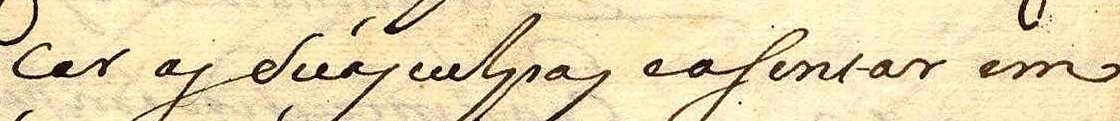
çar as Suas culpas, e asentar em
